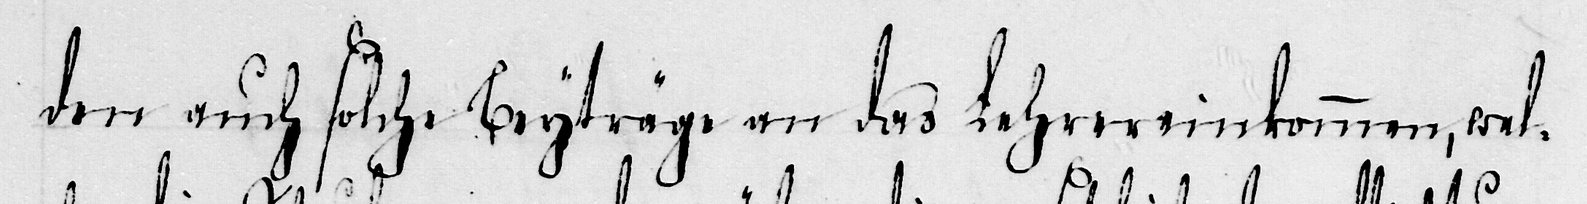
den auch solche Beyträge an das Lehrereinkommen, wel¬
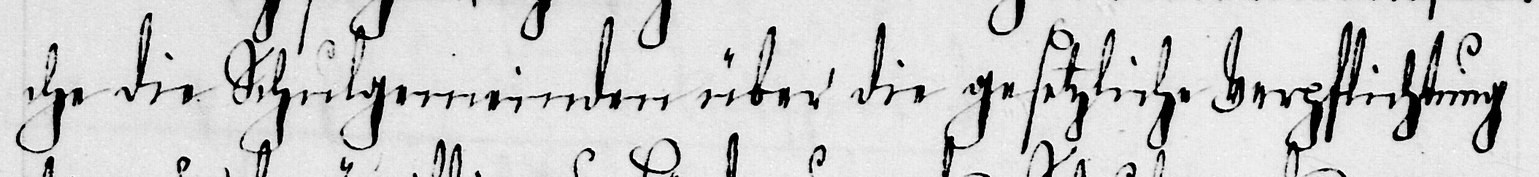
che die Schulgemeinden über die gesetzliche Verpflichtung
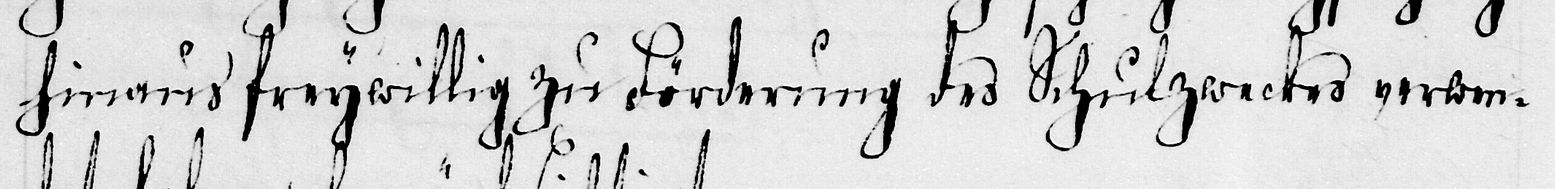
hinaus freywillig zu Förderung des Schulzweckes verwen¬
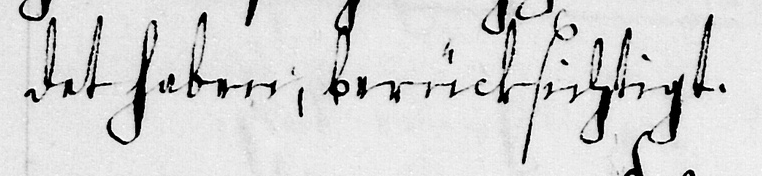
det haben; berücksichtigt.
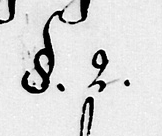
§. 2.
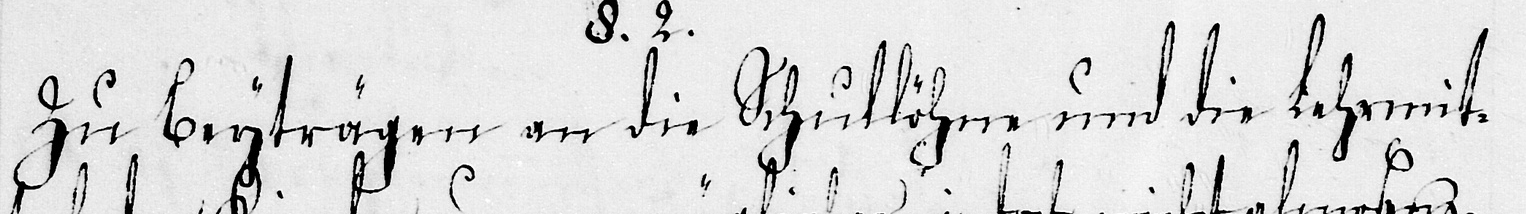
Zu Beyträgen an die Schullöhne und die Lehrmit¬
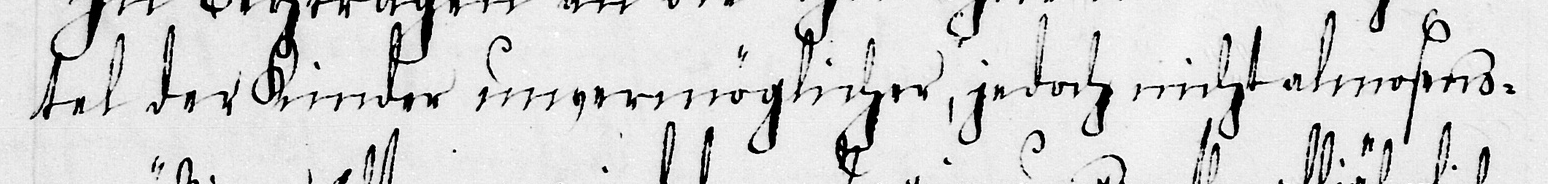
tel der Kinder unvermöglicher, jedoch nicht almosens¬
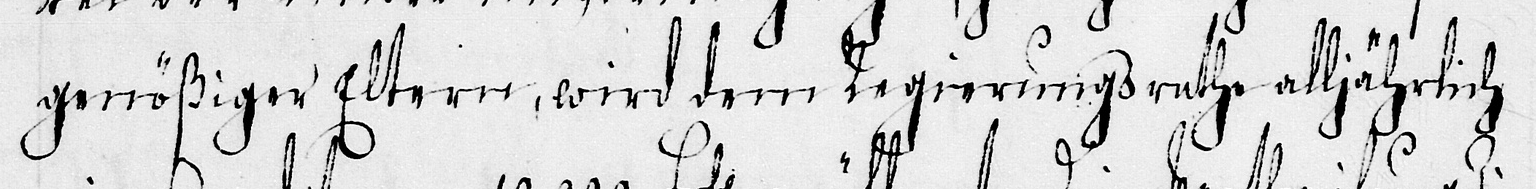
genößiger Eltern, wird dem Regierungsrathe alljährlich
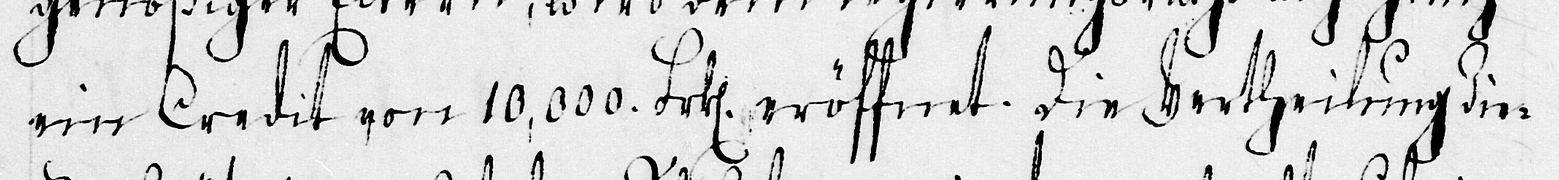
ein Credit von 10,000. Frk[en]. eröffnet. Die Vertheilung die¬
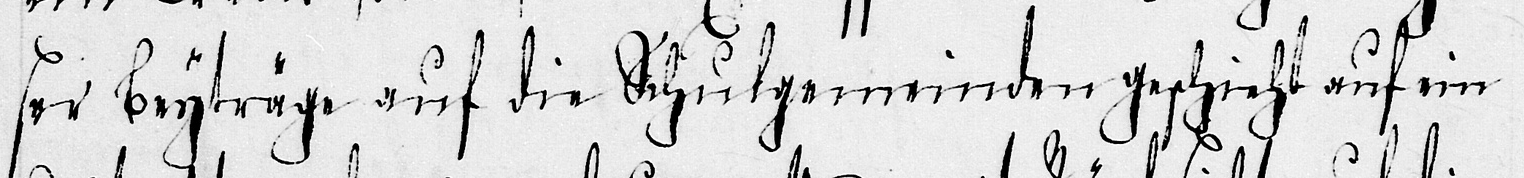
ser Beyträge auf die Schulgemeinden geschieht auf ein
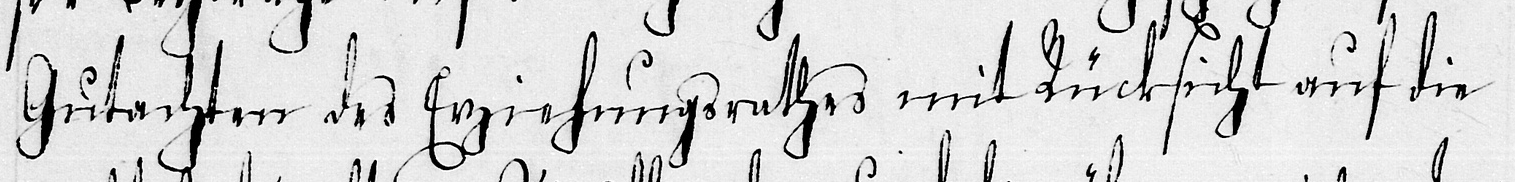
Gutachten des Erziehungsrathes mit Rücksicht auf die
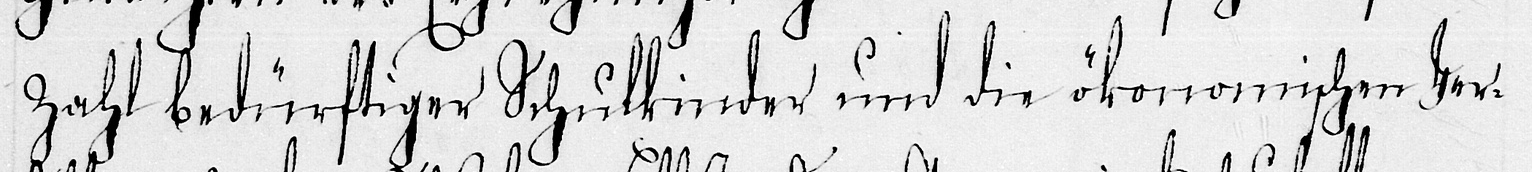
Zahl bedürftiger Schulkinder und die ökonomischen Ver¬
